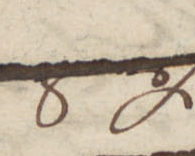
zweitens
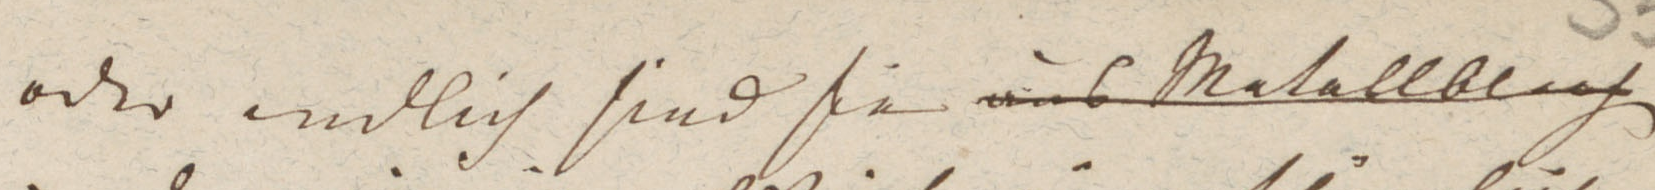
oder endlich sind sie aus Metallblech
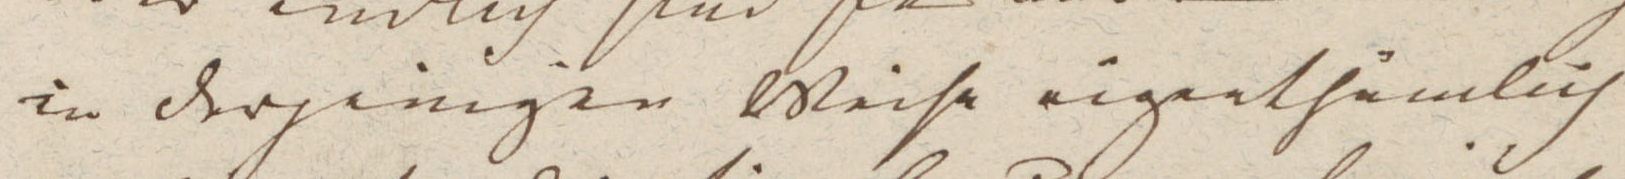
in derjenigen Weise eigenthümlich
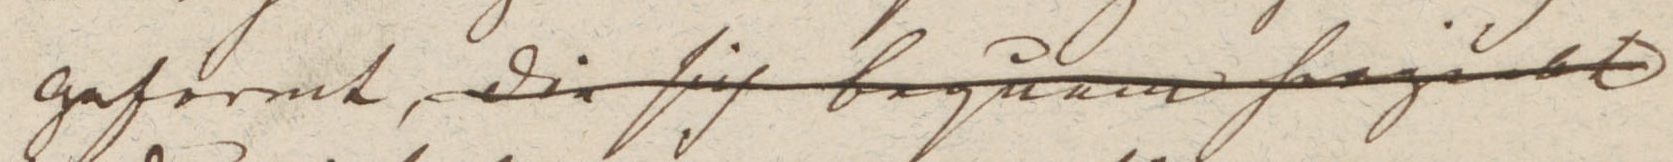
geformt, die sich bequem hingiebt
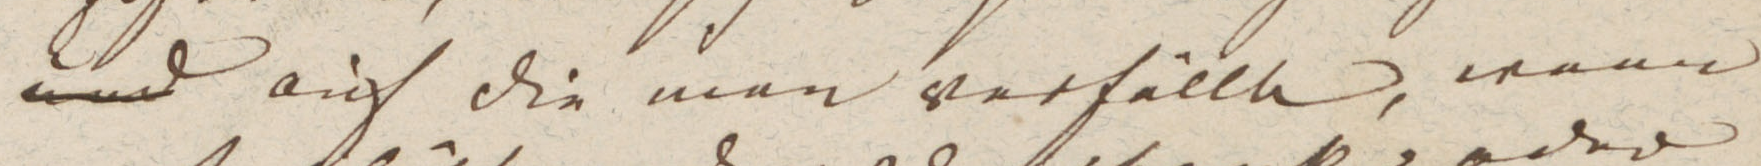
und auf die man verfällt, wenn
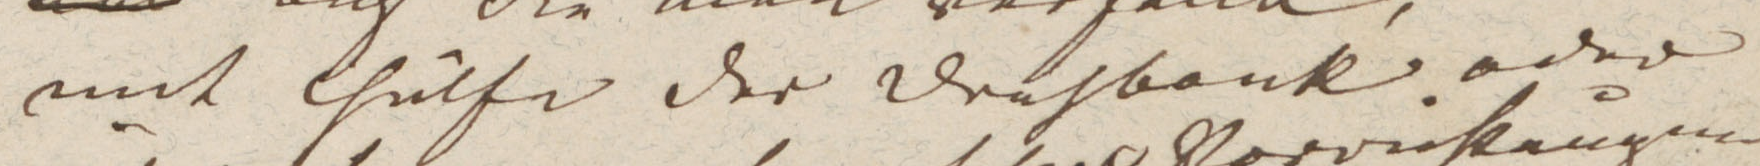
mit Hülfe der Drehbank oder
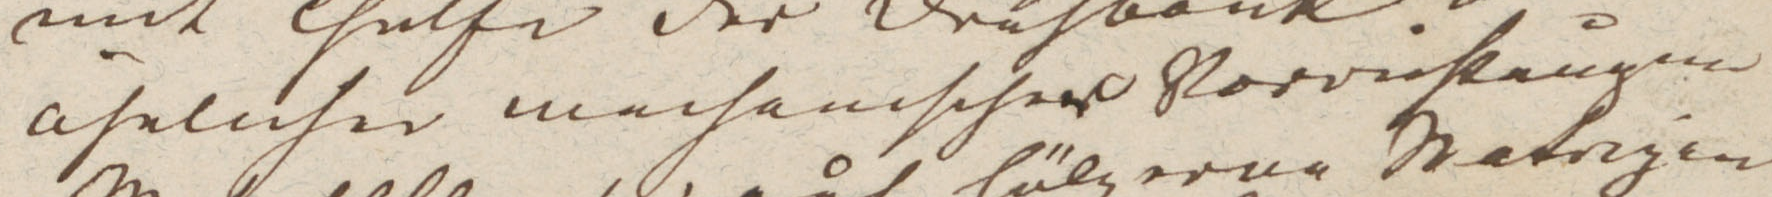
ähnlicher mechanischer Vorrichtungen
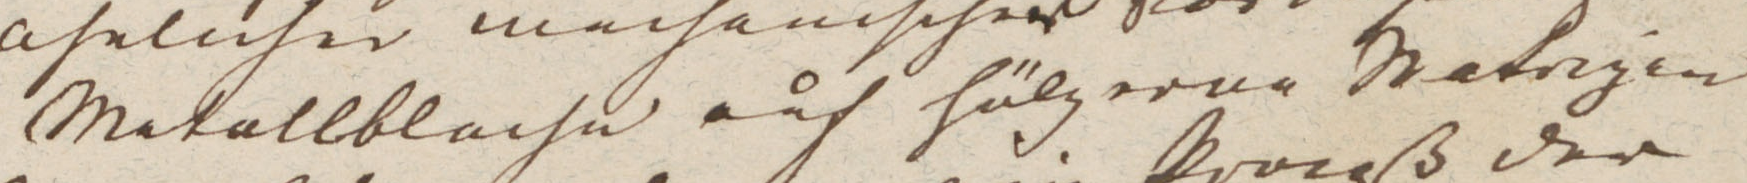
Metallbleche auf hölzerne Matrizen
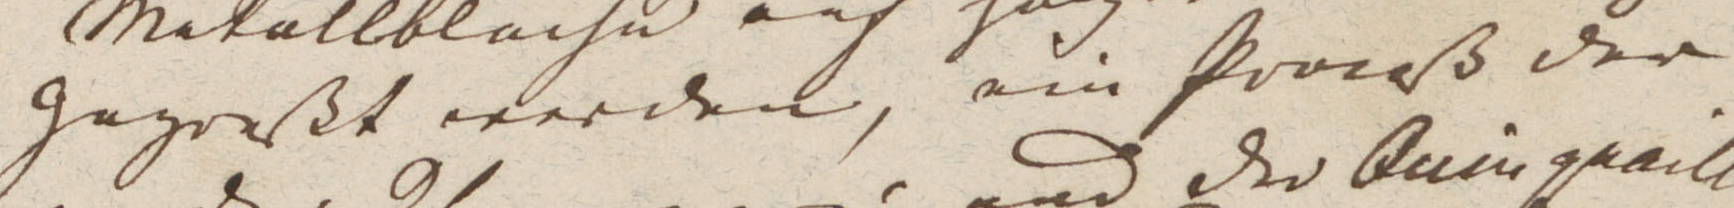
gepresst werden, ein Process der
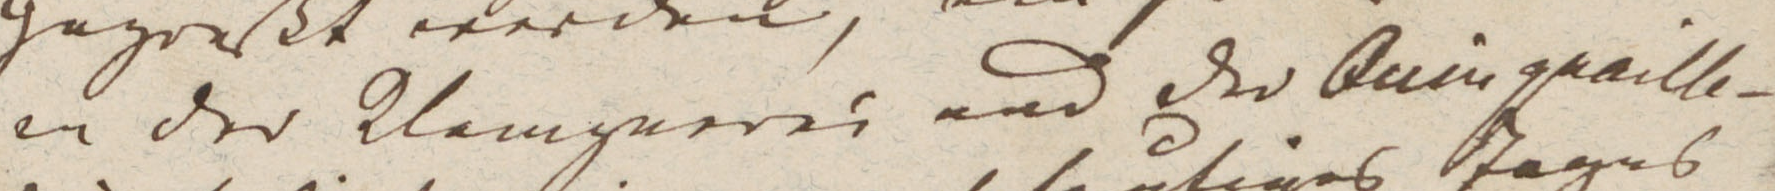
in der Klempnerei und der Quinquaille-
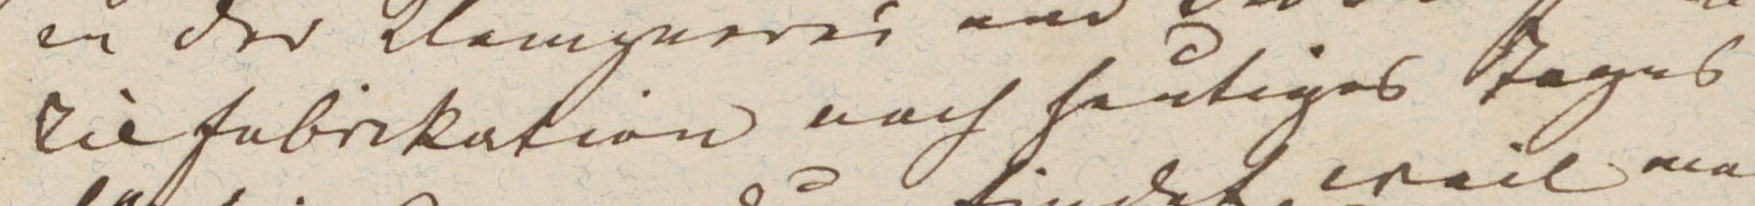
riefabrikation noch heutiges Tages
